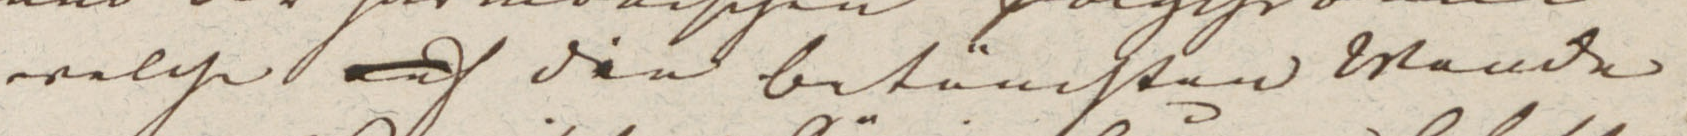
welche auf deie betünchten Wande
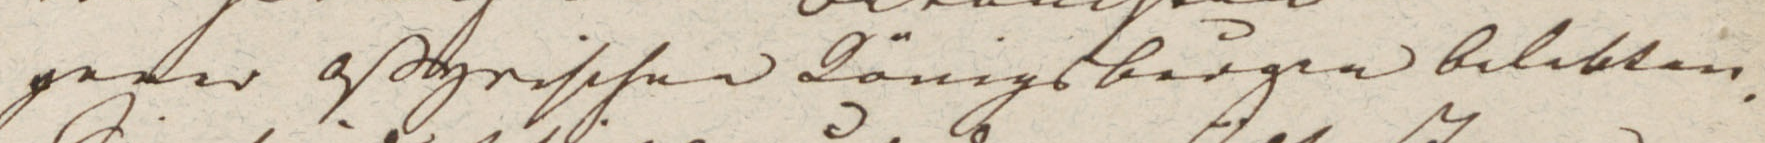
jener assyrischen Königsburgen belebten.
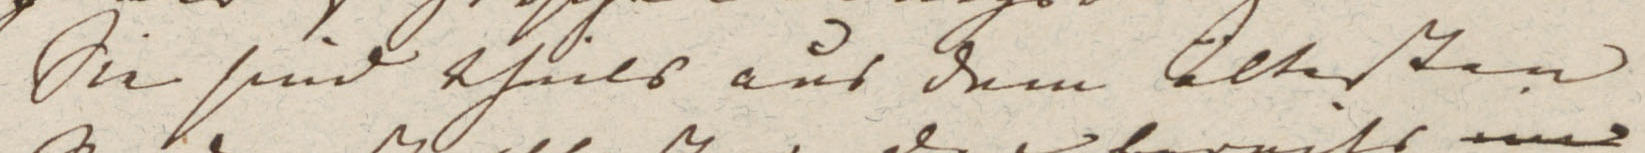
Sie sind theils aus dem ältesten
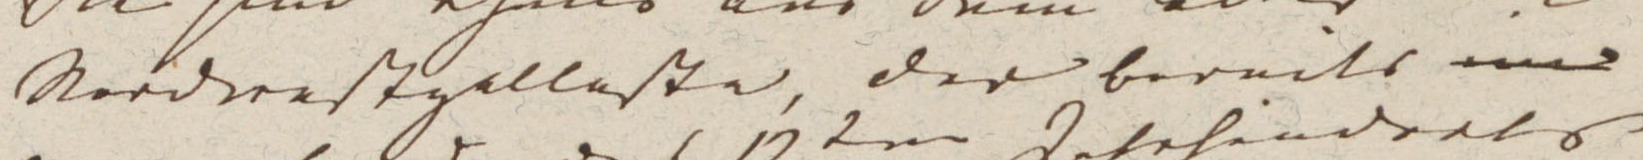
Nordwestpallaste, der bereits im
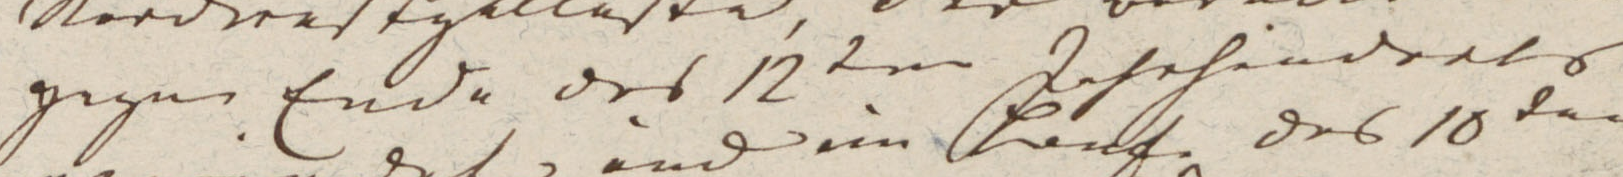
gegen Ende des 12ten Jahrhunderts
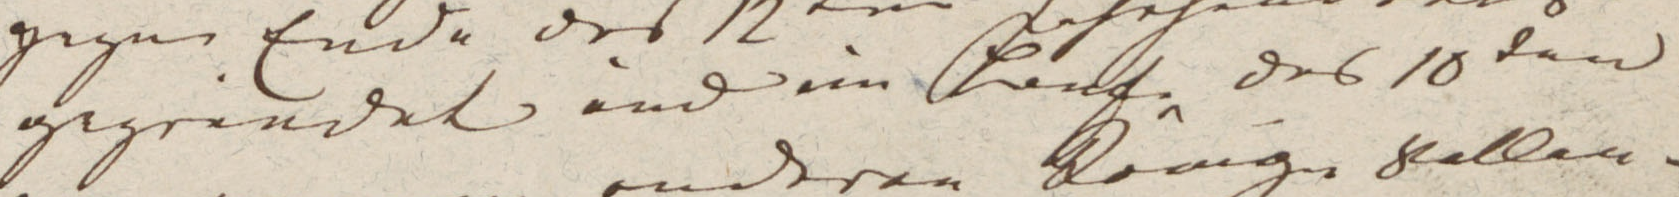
gegründet und im Laufe des 10ten
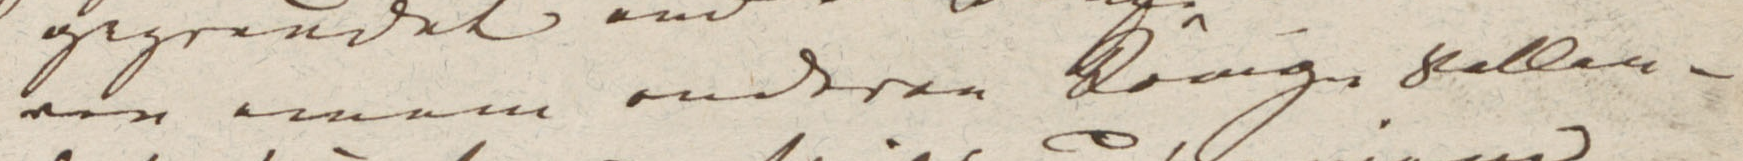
von einem anderen Könige vollen-
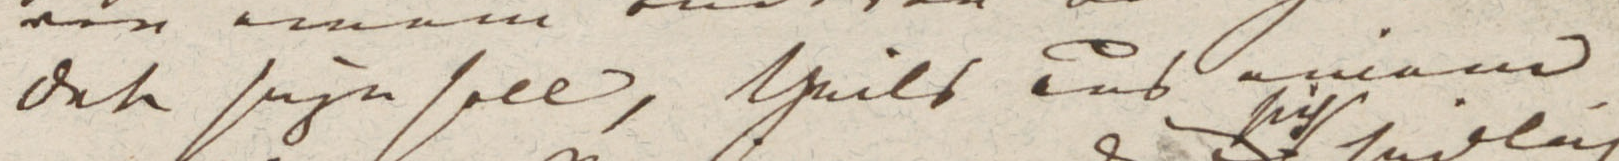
det seyn soll, theils aus einem
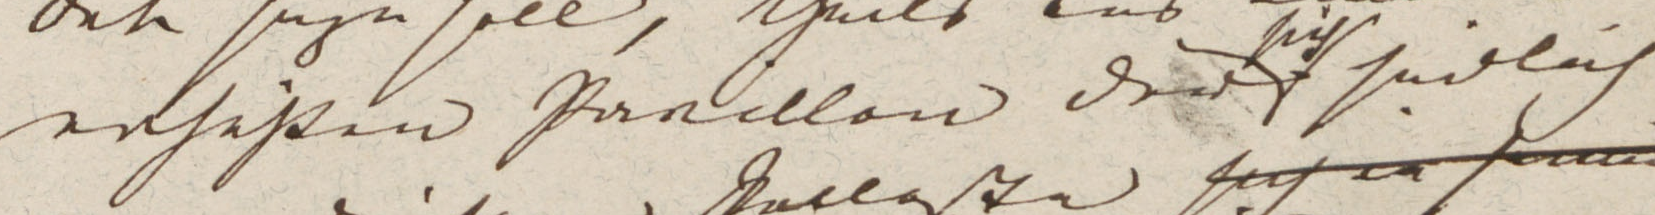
erhöhten Pavillon der sich südlich
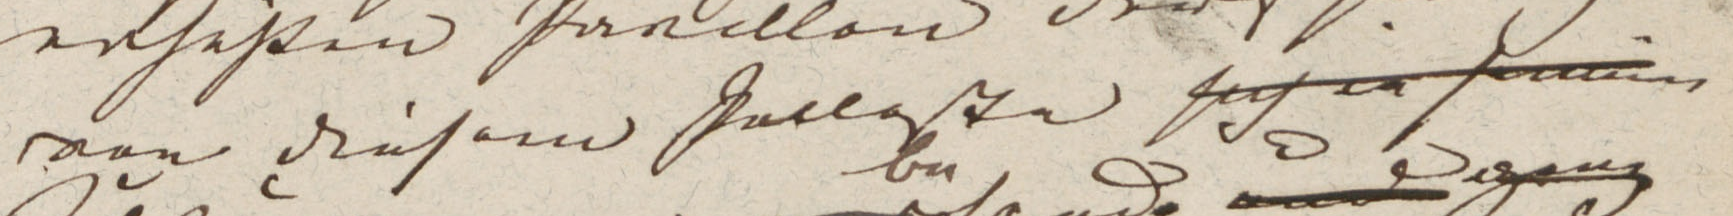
von diesem Pallaste sich in seinem
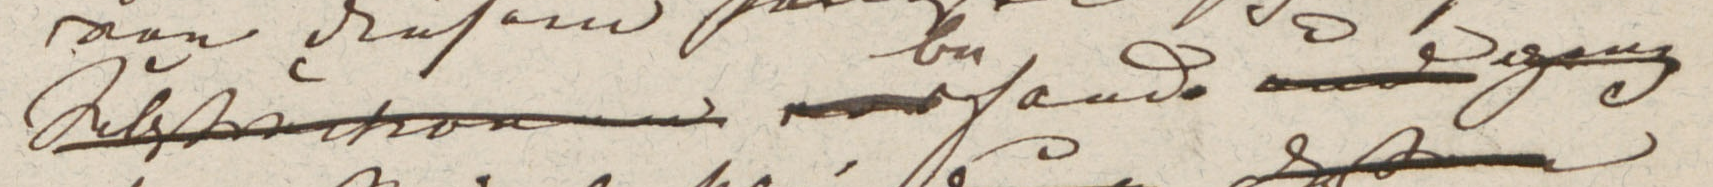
Substructionen vorbefand. und ganz
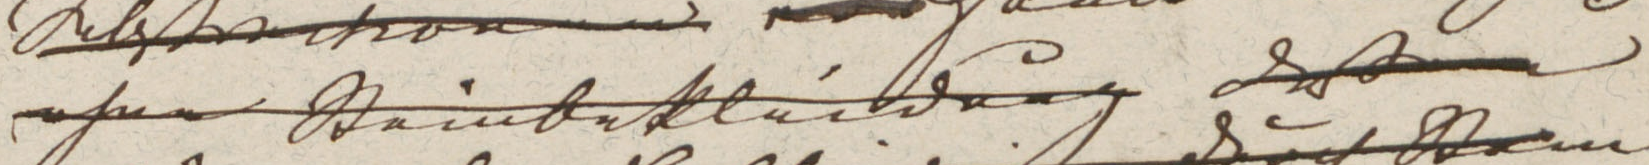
ohne Steinbekleidung dessen
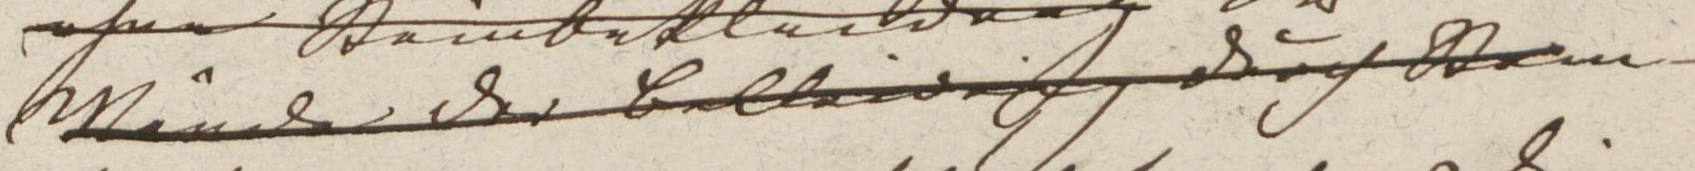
Wände der Bekleidung durch Stein-
